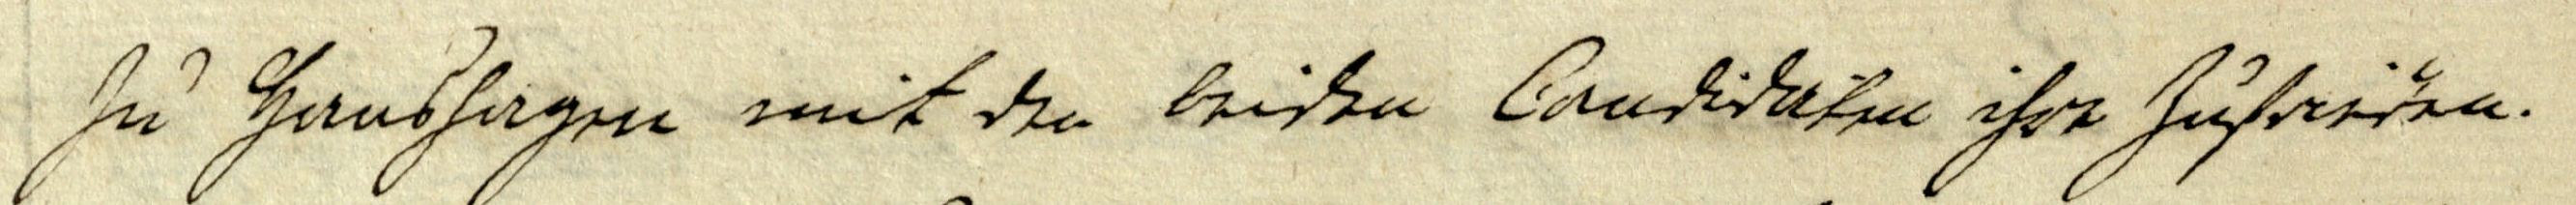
zu Hanshagen mit den beiden Candidaten ihre Zufrieden¬
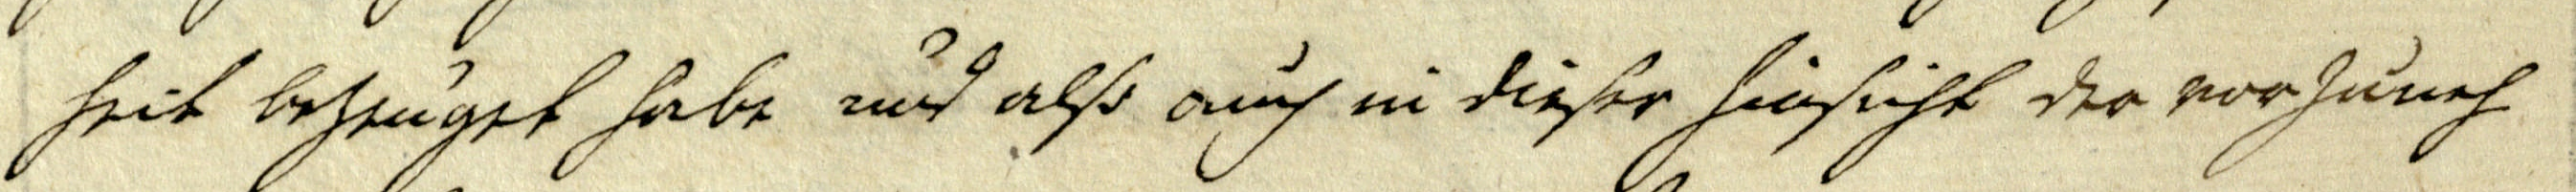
heit bezeuget habe und also auch in dieser hinsicht der vorzuneh¬
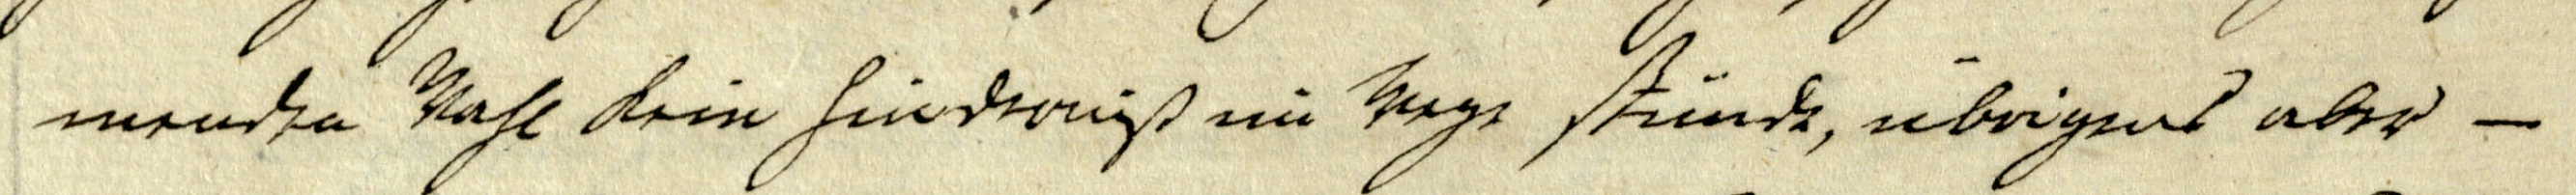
menden Wahl kein hinderniß im Wege stünde, übrigens aber
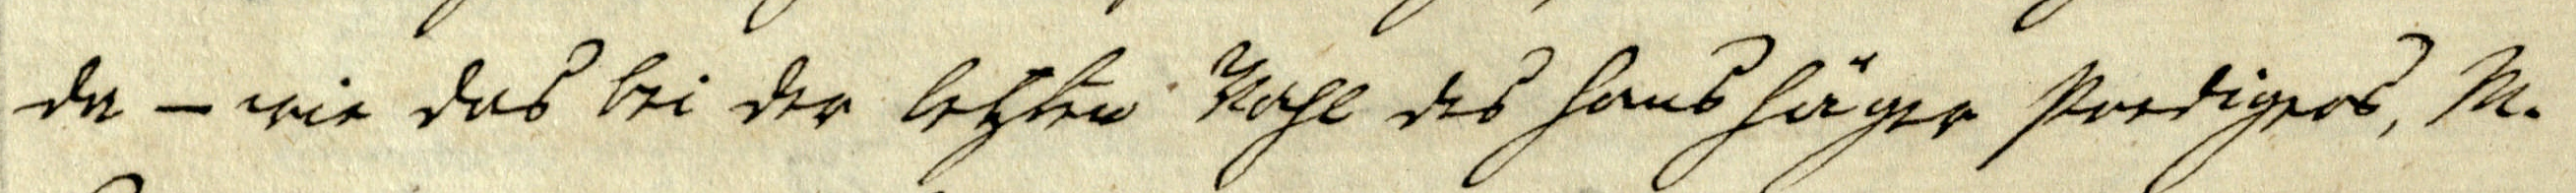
da wie das bei der letzten Wahl des hanshäger Predigers, M.
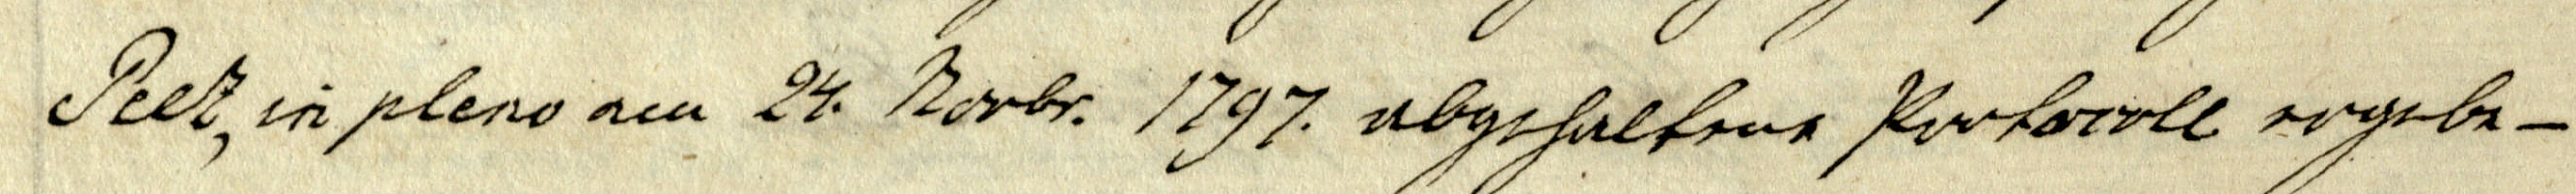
Pelz, in pleno am 24. Novbr. 1797. abgehaltene Protocoll ergebe,
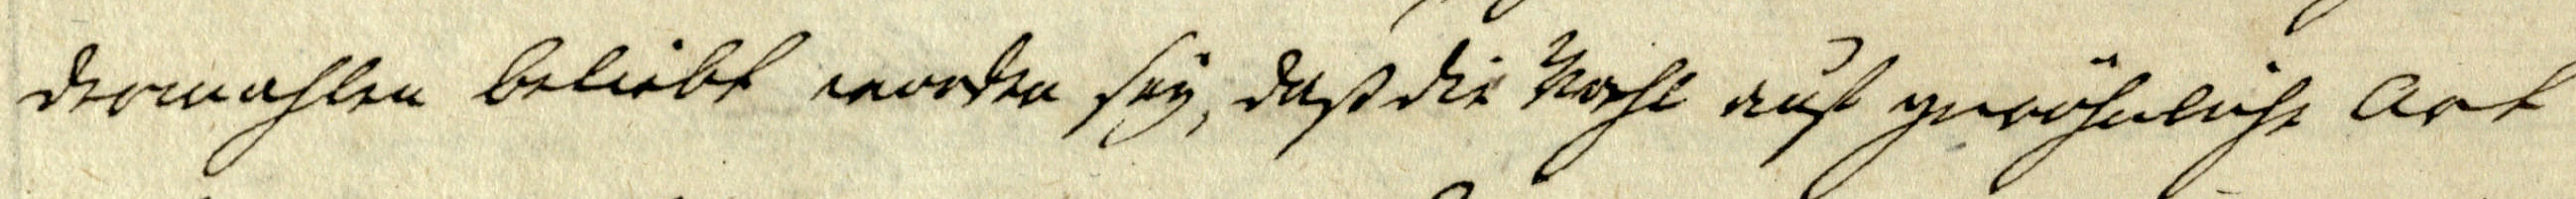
dermahlen beliebt worden seÿ, daß die Wahl auf gewöhnliche Art
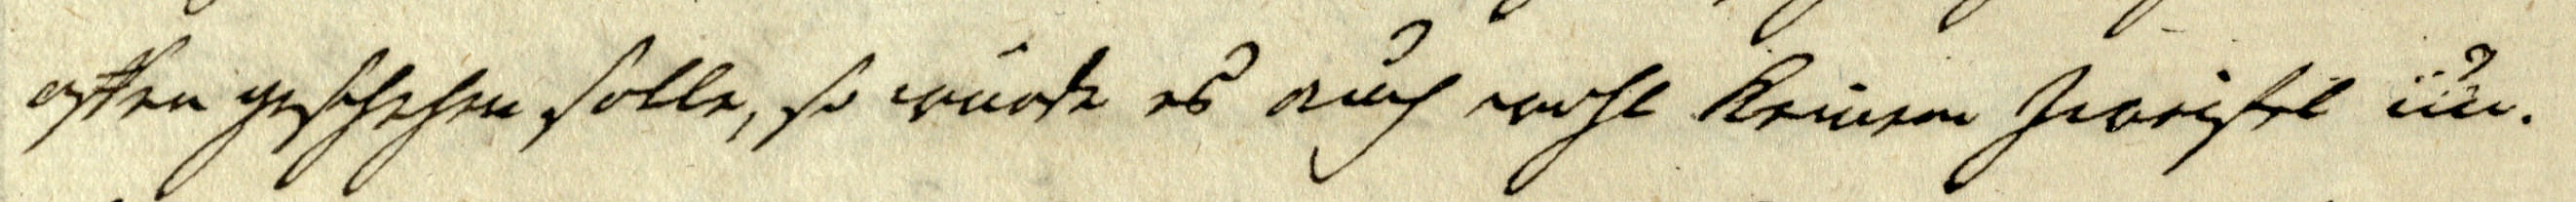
offen geschehen solle, so würde es auch wohl keinem Zweifel un¬
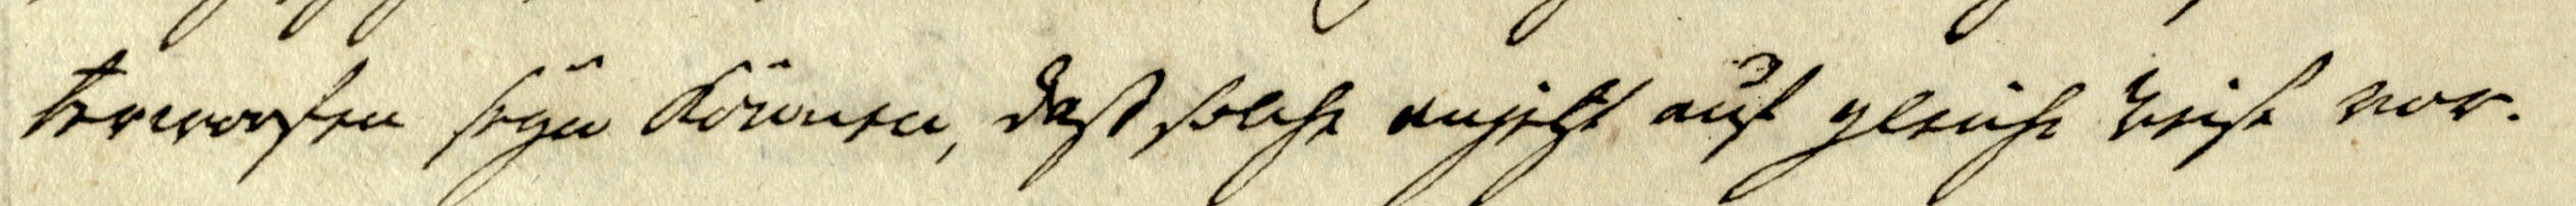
terworfen seÿn können, daß solche anjetzt auf gleiche Weise vor¬
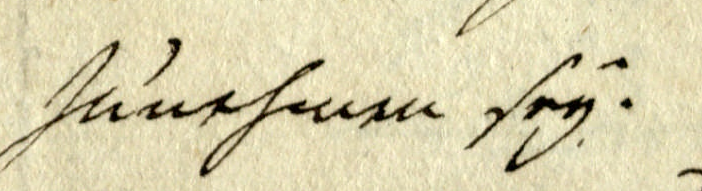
zunehmen seÿ.
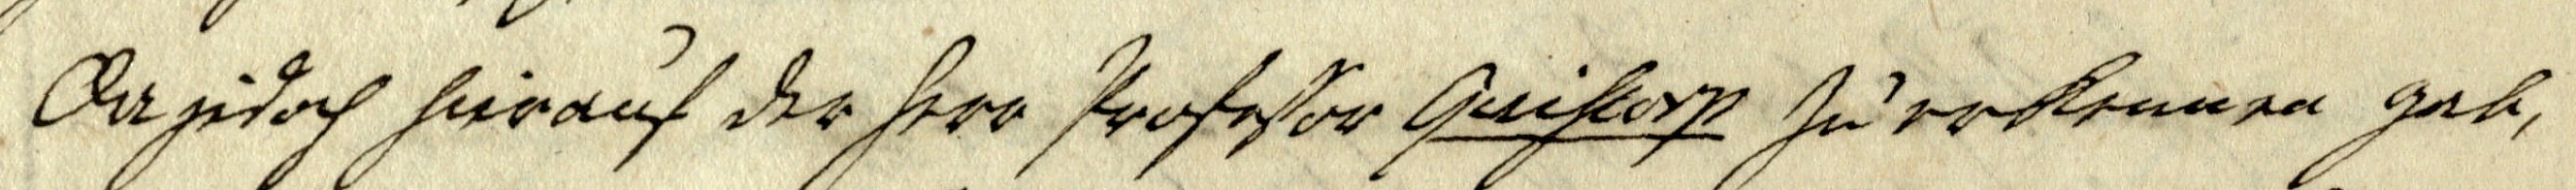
Da jedoch hierauf der herr Professor Quistorp zu erkennen gab,
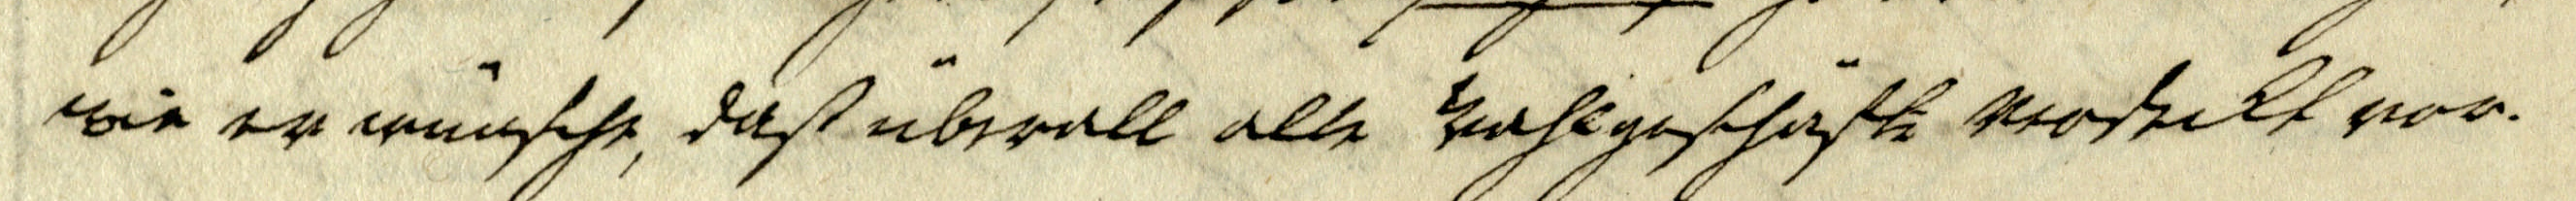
wie er wünsche, daß überall alle Wahlgeschäfte verdeckt vor¬
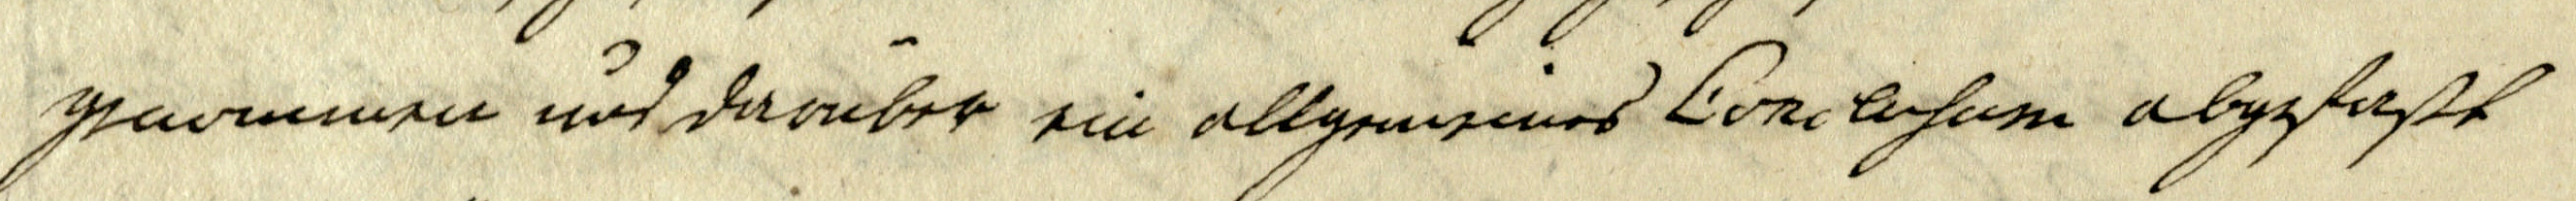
genommen und darüber ein allgemeines Conclusum abgefaßt
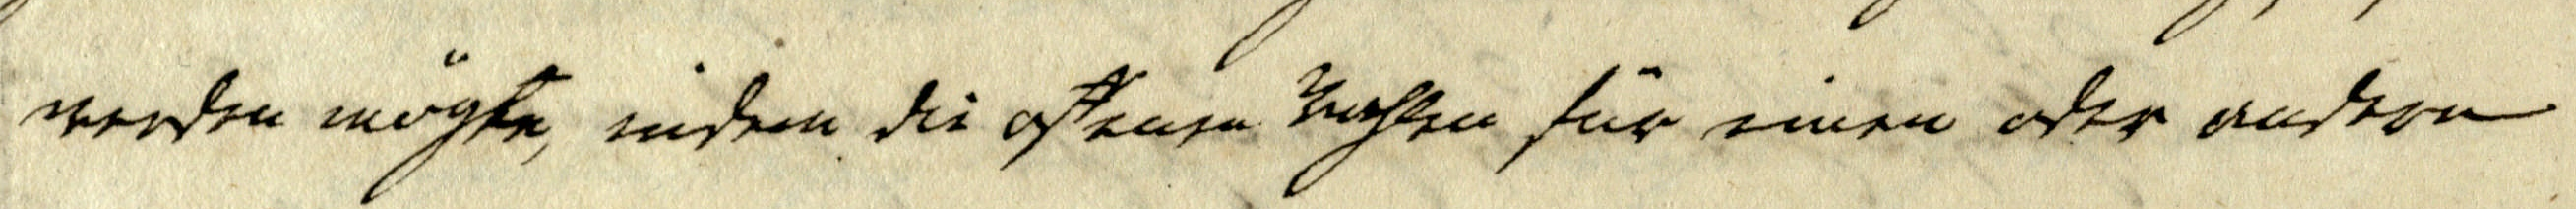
werden mögte, indem die offenen Wahlen für einen oder andern
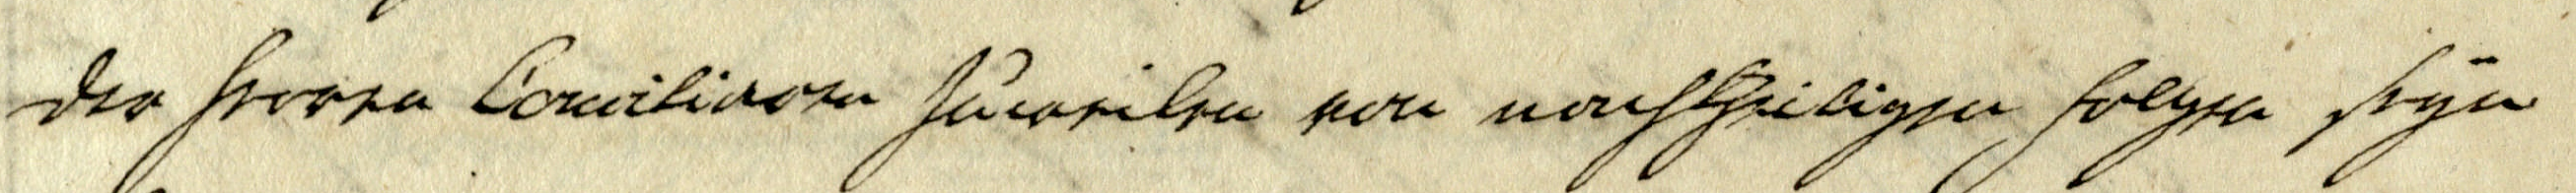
der herren Conciliaren zuweilen von nachtheiligen Folgen seÿn
